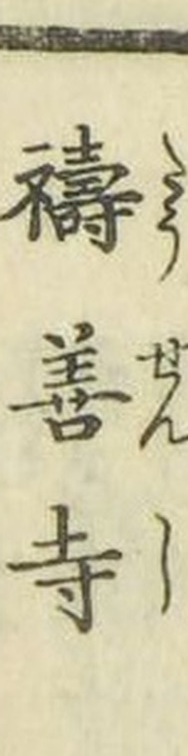禱善寺
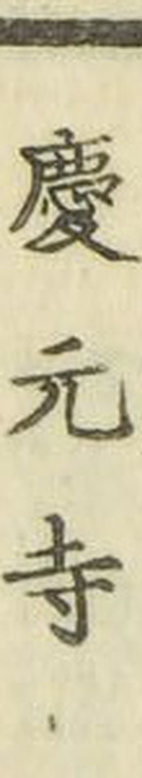慶元寺

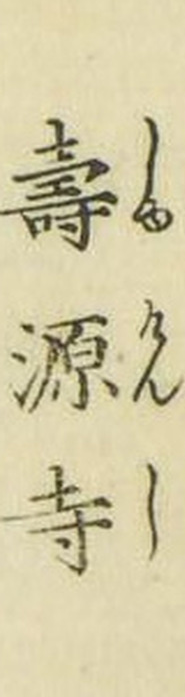壽源寺
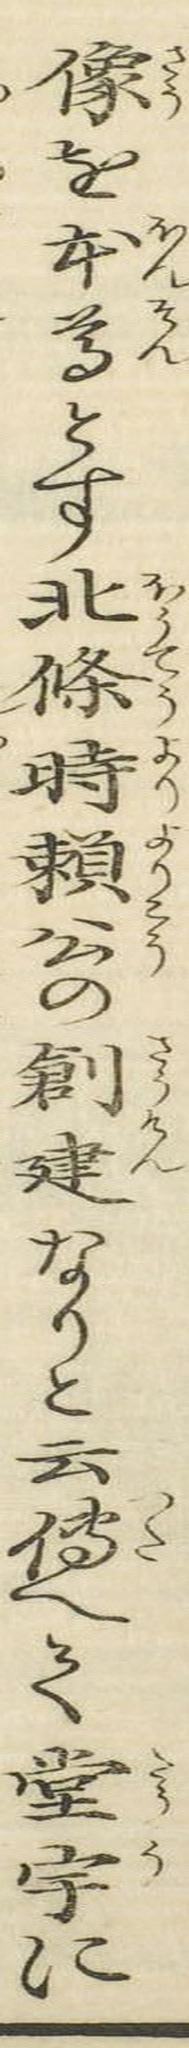像を本尊とす北條時頼公の創建なりと云傳へて堂宇に
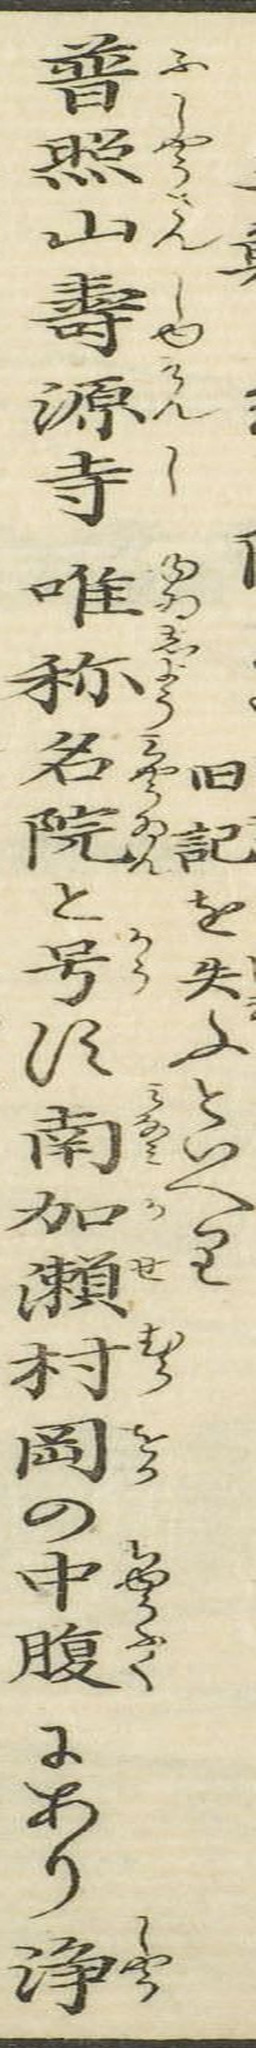普照山壽源寺唯称名院と号す南加瀬村岡の中腹にあり浄
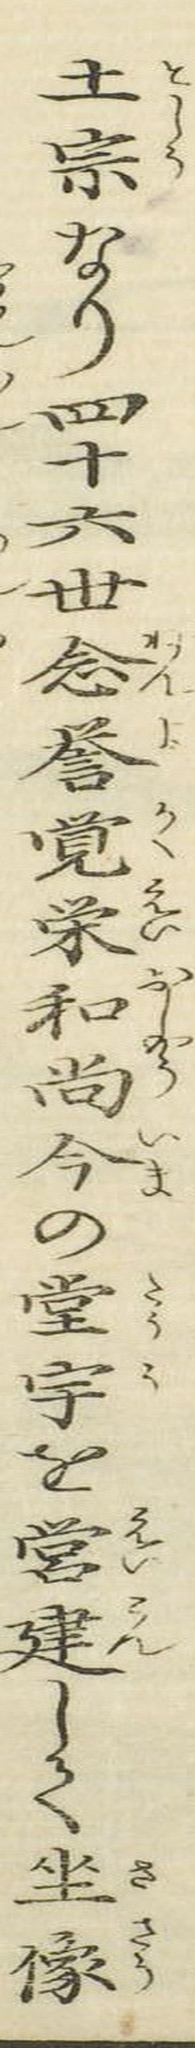土宗なり四十六世念誉覚栄和尚今の堂宇を営建して坐像
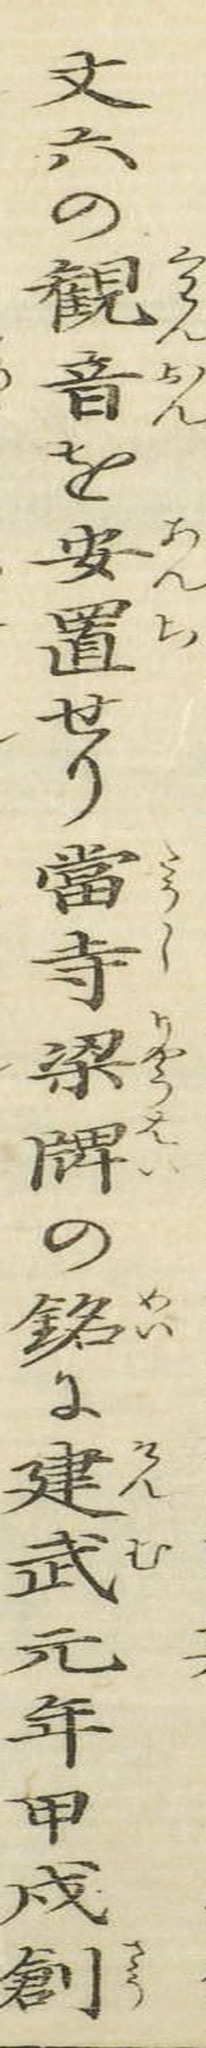丈六の観音を安置せり當寺梁牌の銘に建武元年甲戌創
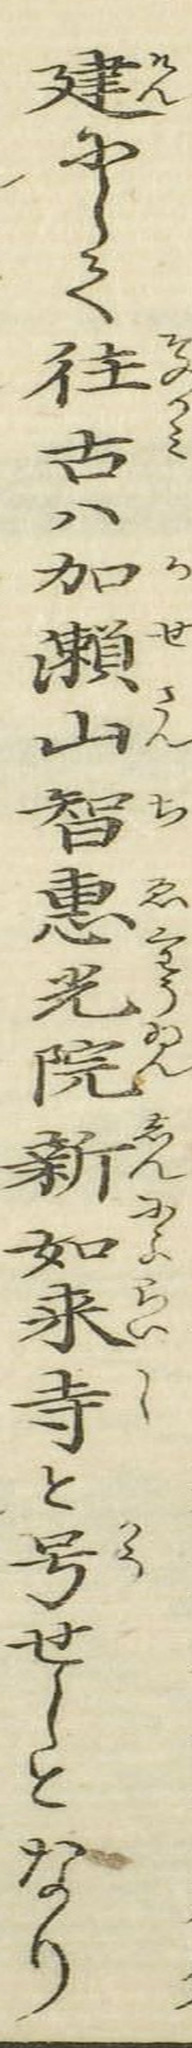建にして往古は加瀬山智惠光院新如来寺と号せしとなり
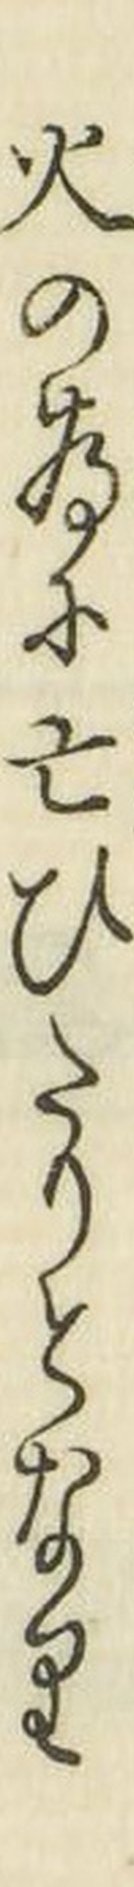火の為に亡ひたりとなり
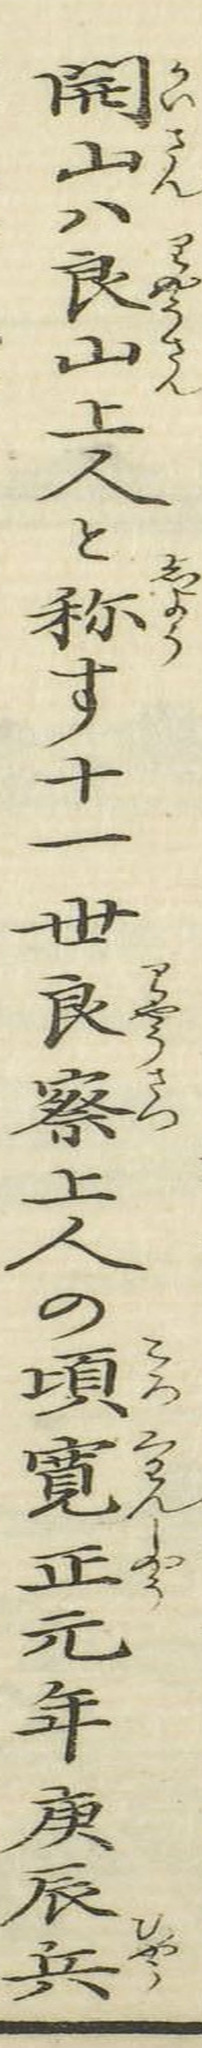開山は良山上人と称す十一世良察上人の頃寛正元年庚辰兵
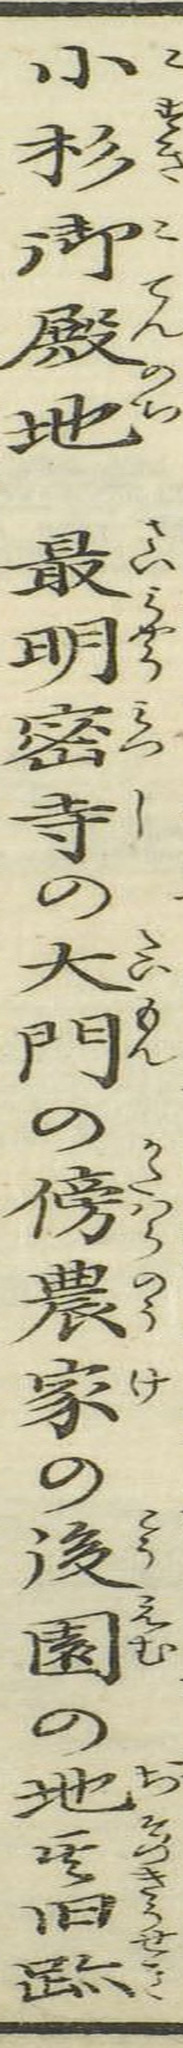小杉御殿地最明密寺の大門の傍農家の後園の地其旧跡
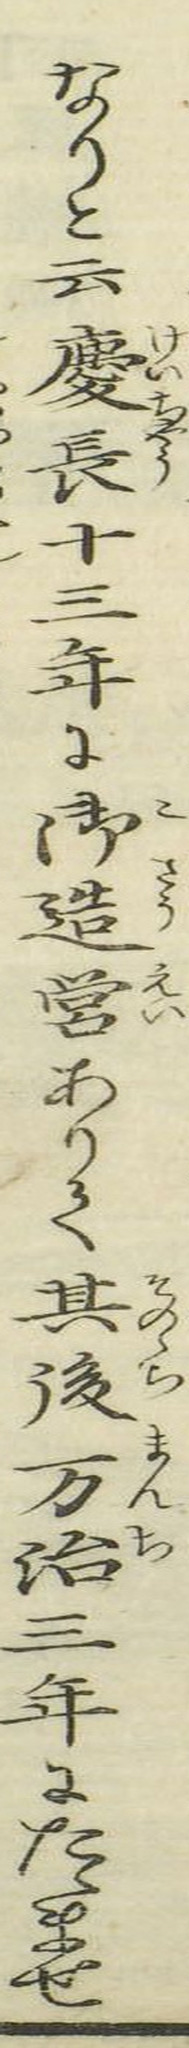なりと云慶長十三年に御造営ありて其後万治三年にたゝませ
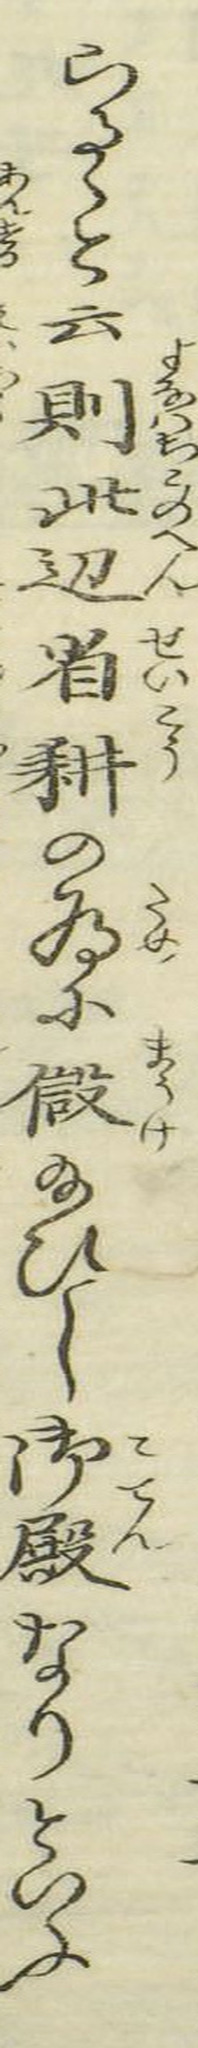らるゝと云則此辺省耕の為に給ひし御殿なりといふ

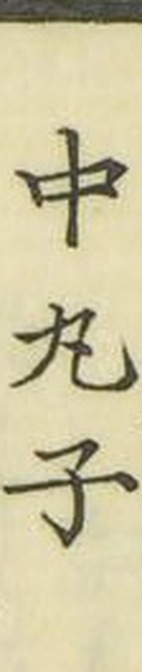中丸子
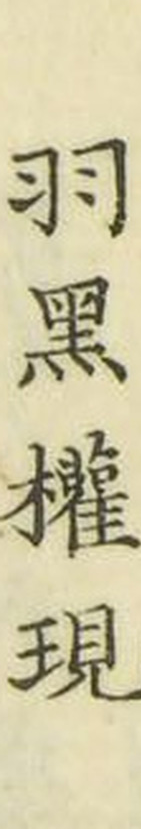羽黑權現
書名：江戸名所図会 20巻 巻之8
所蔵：東京学芸大学教育コンテンツアーカイブ
